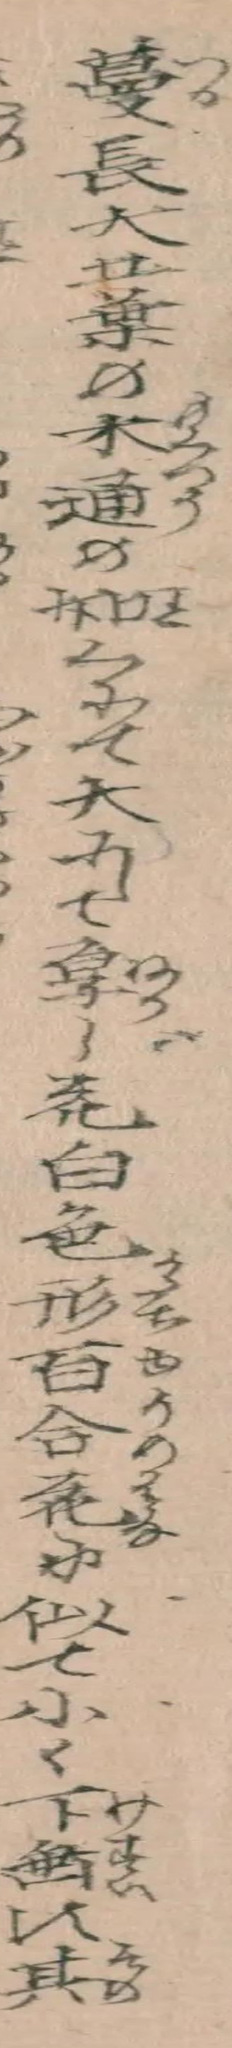蔓長大五葉の木通の如くにて大にして厚し花白色形百合花に似て小く下垂す其
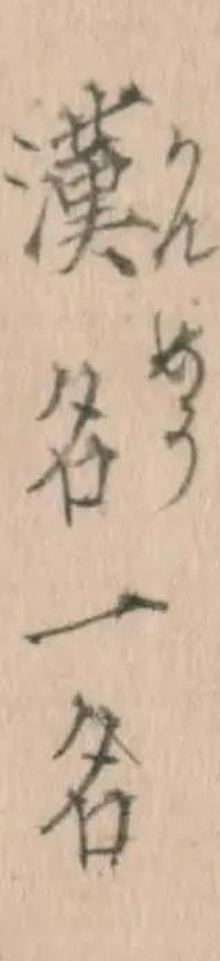漢名一名
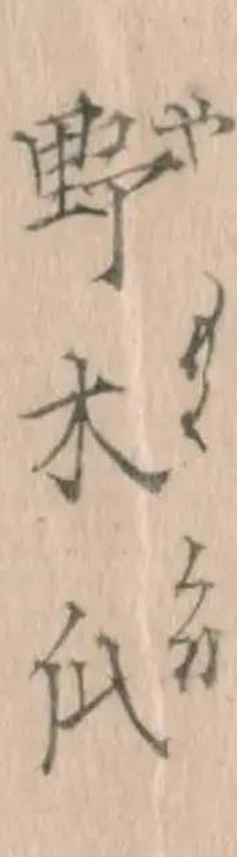野木瓜

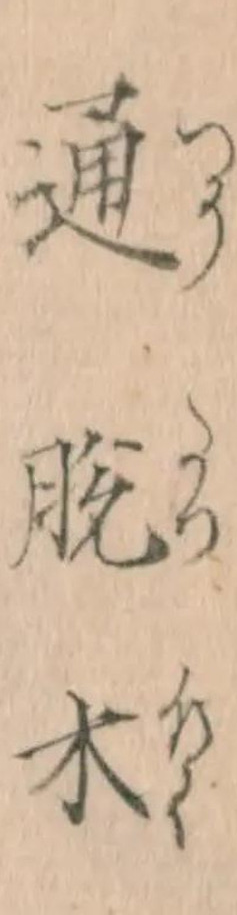通脱木
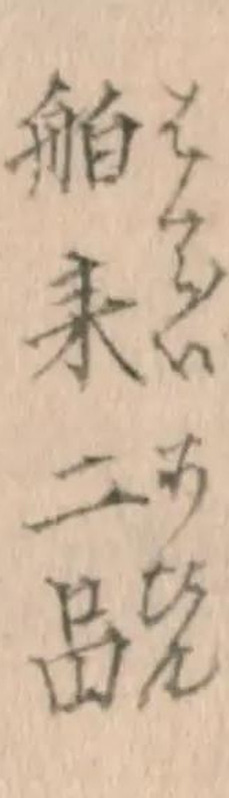舶来二品

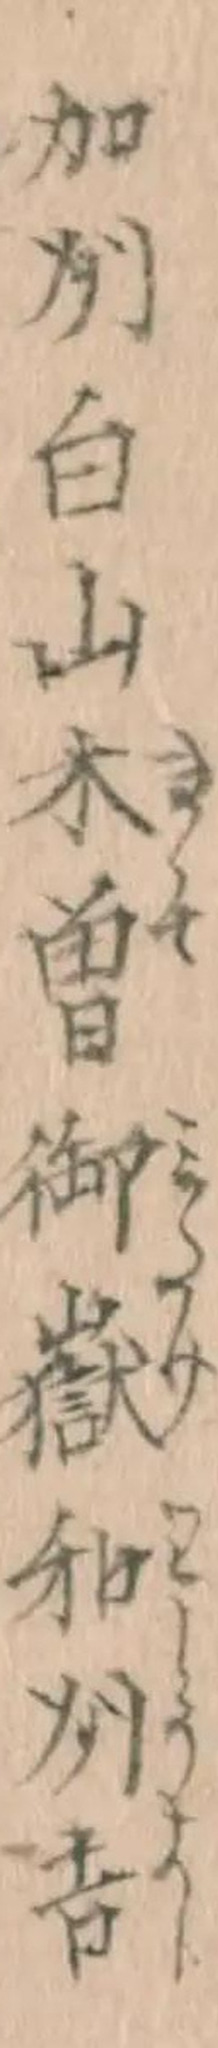加州白山木曽御岳和州吉
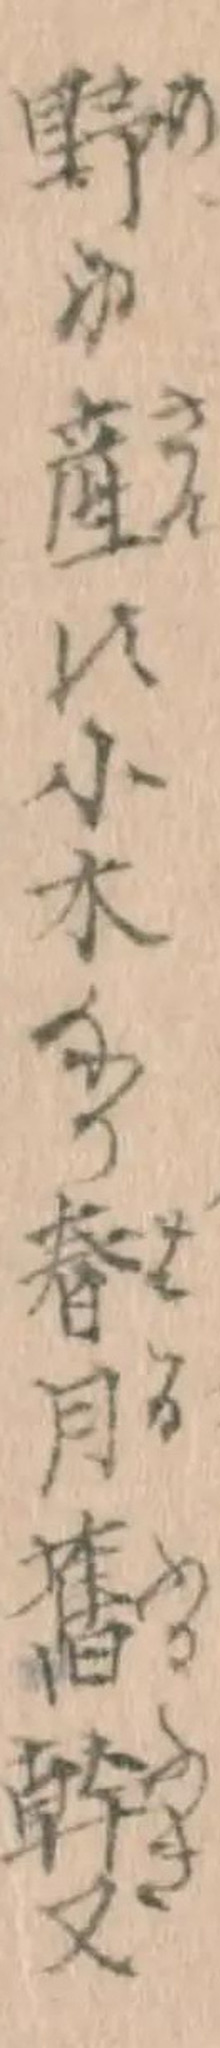野に産す小木なり春月旧幹又
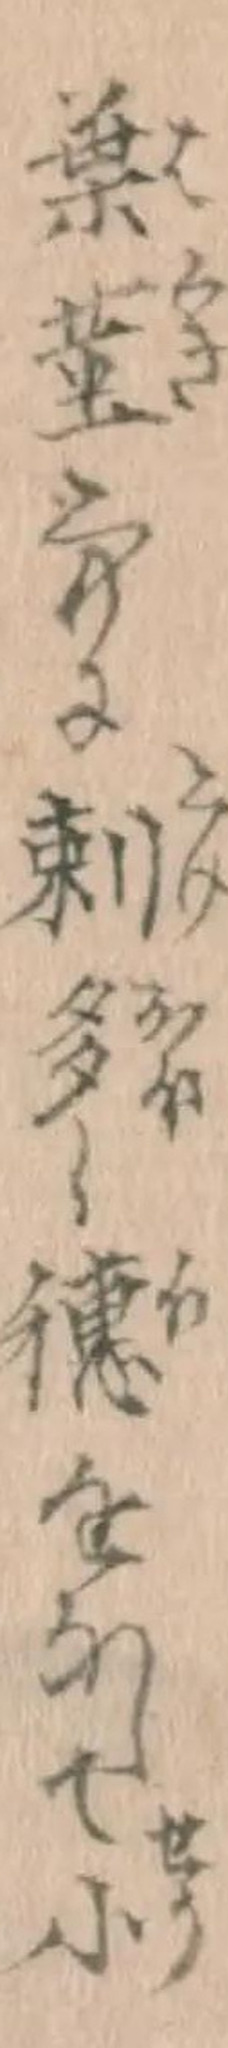葉茎ともに剌多し穂をなして小
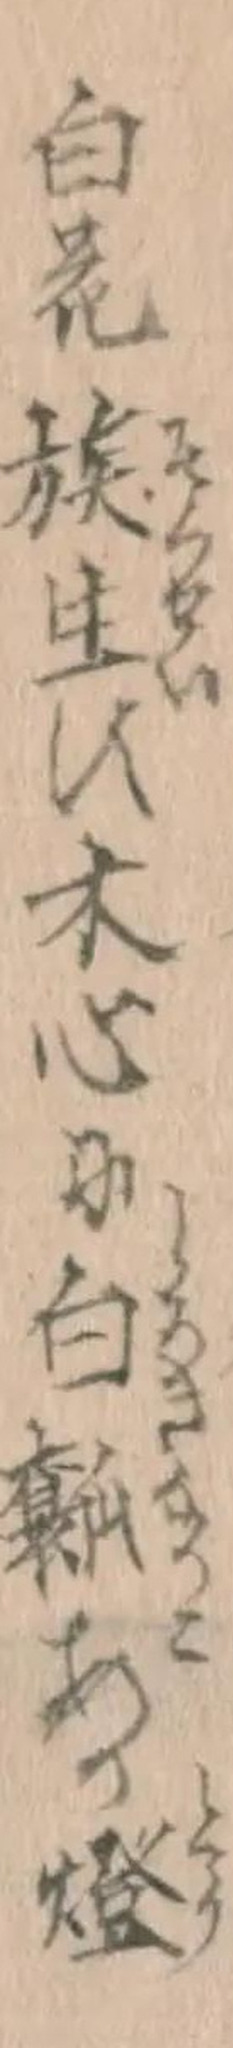白花族生す木心に白瓤あり灯
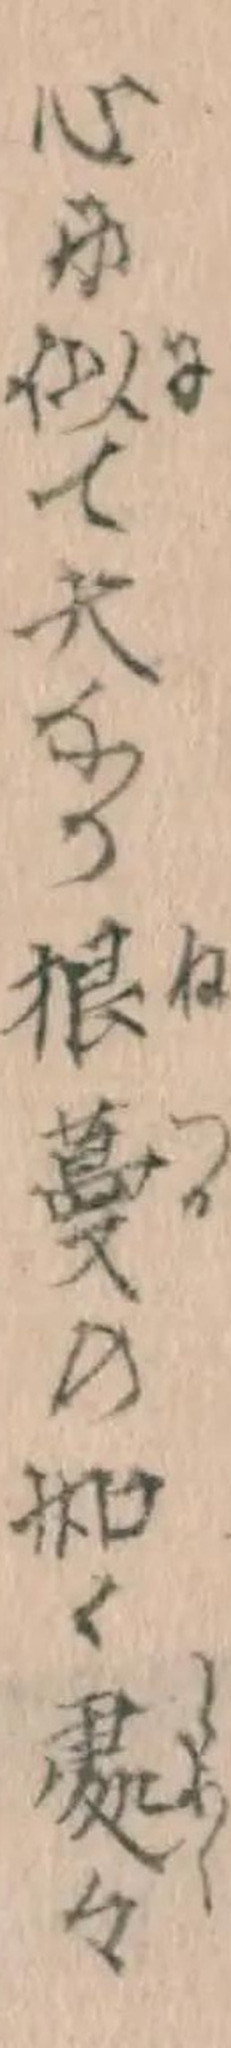心に似て大なり根蔓の如く処々

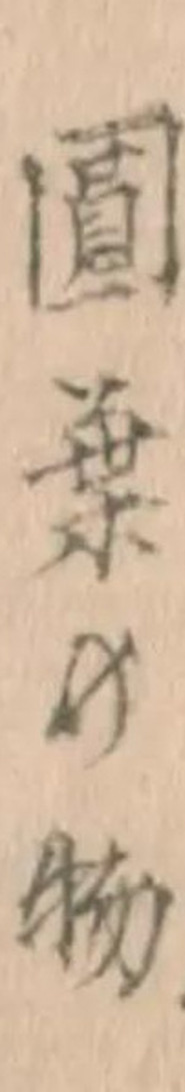円葉の物
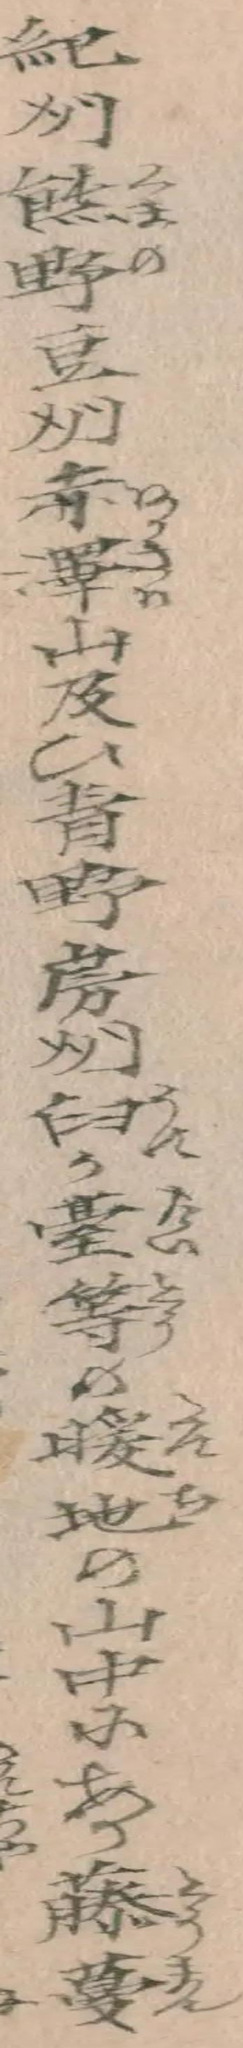紀州熊野豆州赤沢山及ひ青野房州臼か台等の暖地の山中にあり藤蔓
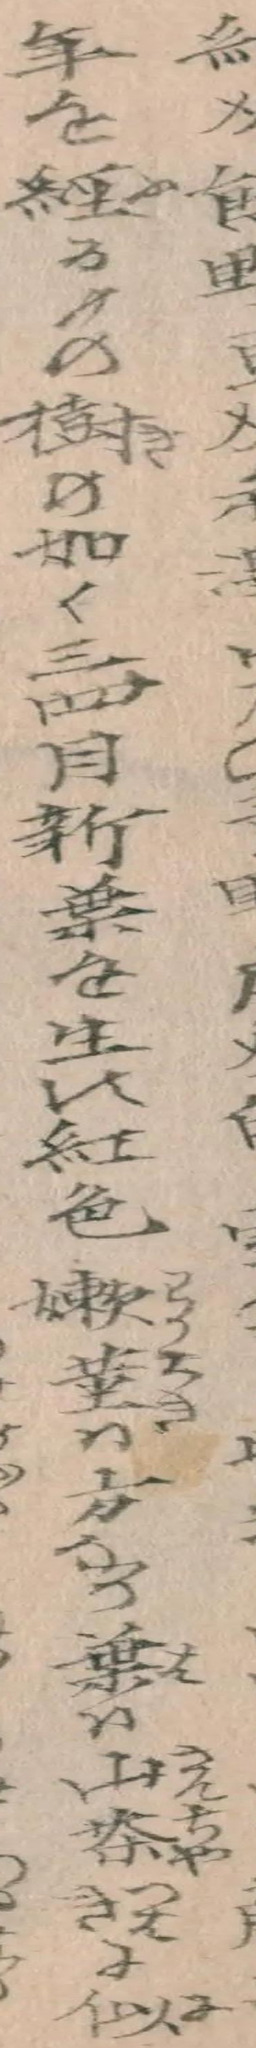年を経るもの樹の如く三四月新葉を生す紅色嫩茎は方なり葉は山茶つはきに似
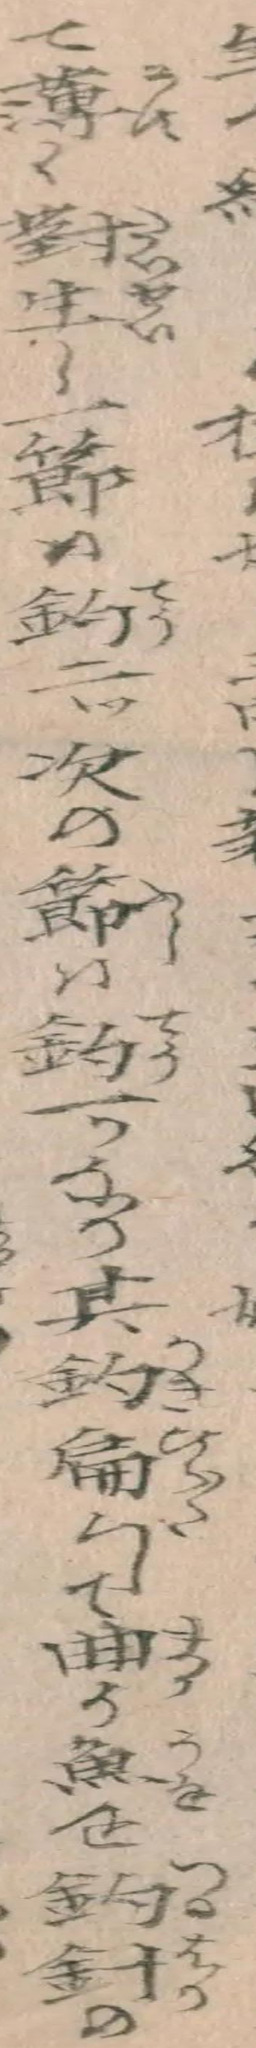て薄く対生し一節は釣二つ次の節は釣一つなり其釣扁くして曲り魚を釣針の
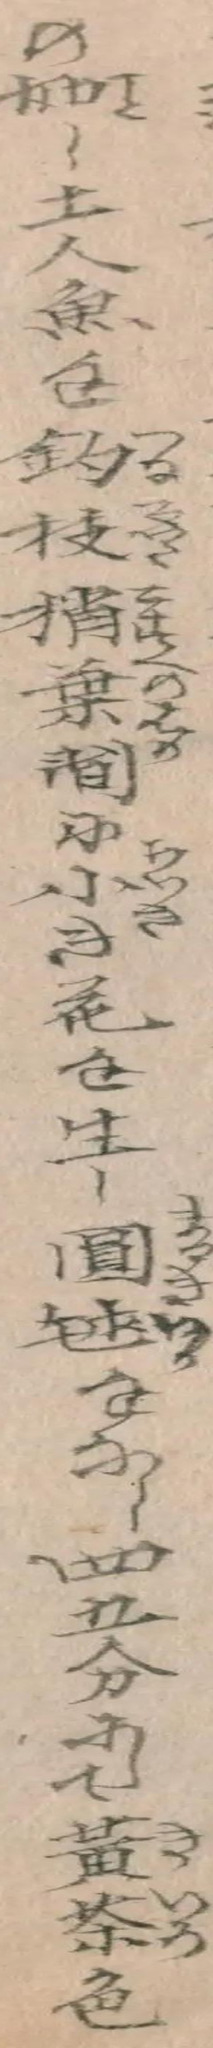の如し土人魚を釣枝梢葉間に小き花を生し円毬をなし四五分にして黄茶色

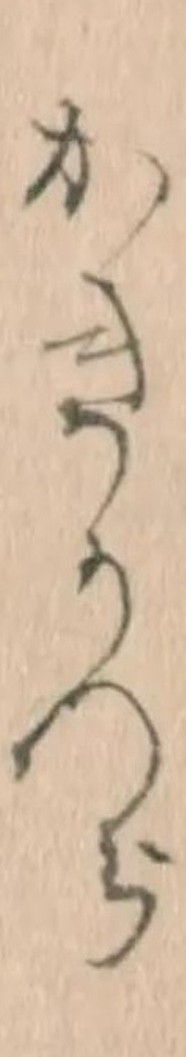かきかつら
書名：本草図譜. 巻28-30
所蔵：国立国会図書館 National Diet Library, JAPAN
